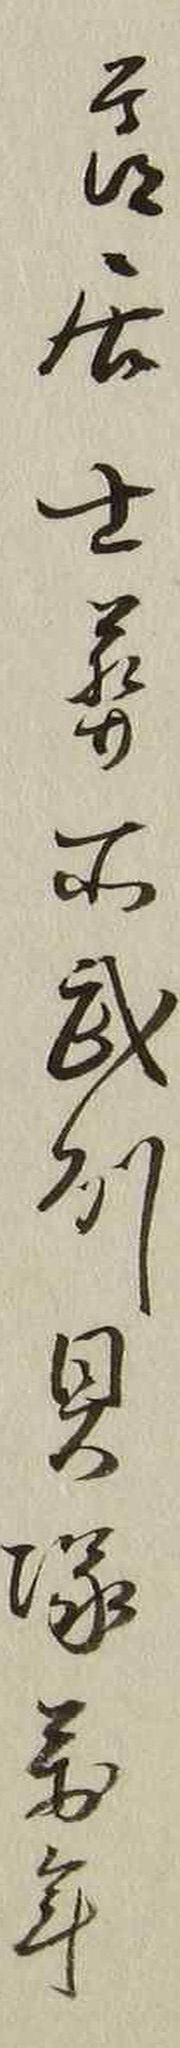節居士葬所武州貝塚万年
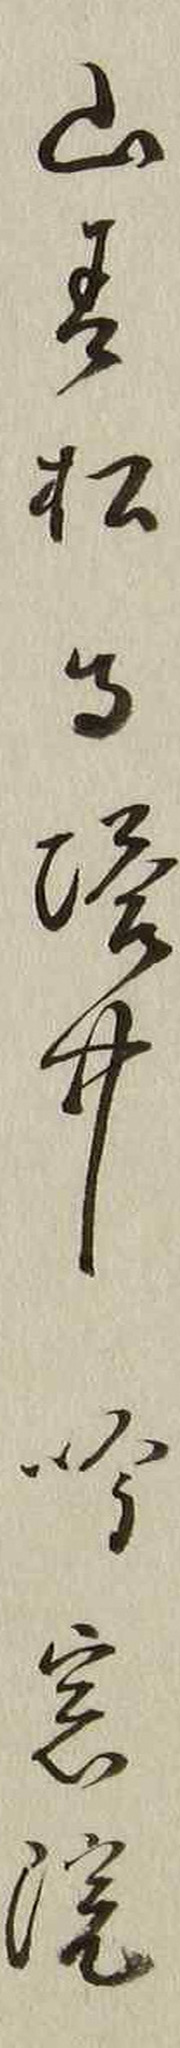山青松寺塔中吟窓院
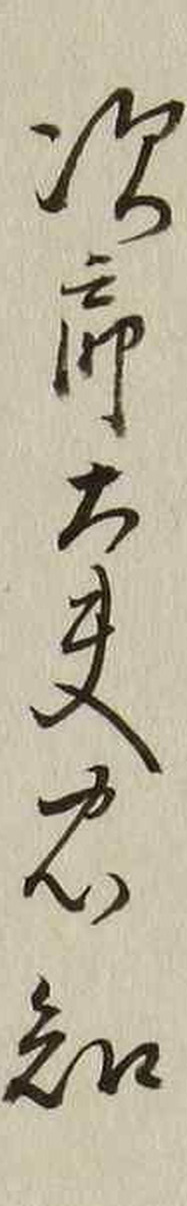次郎太夫忠知
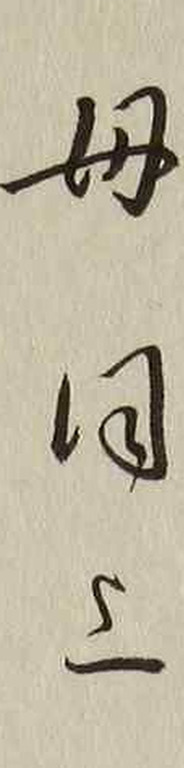母同上
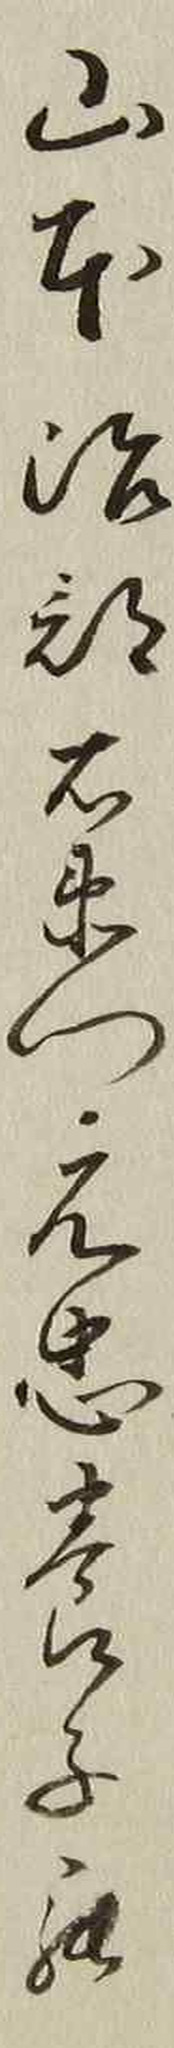山本治部右衛門元忠養子被
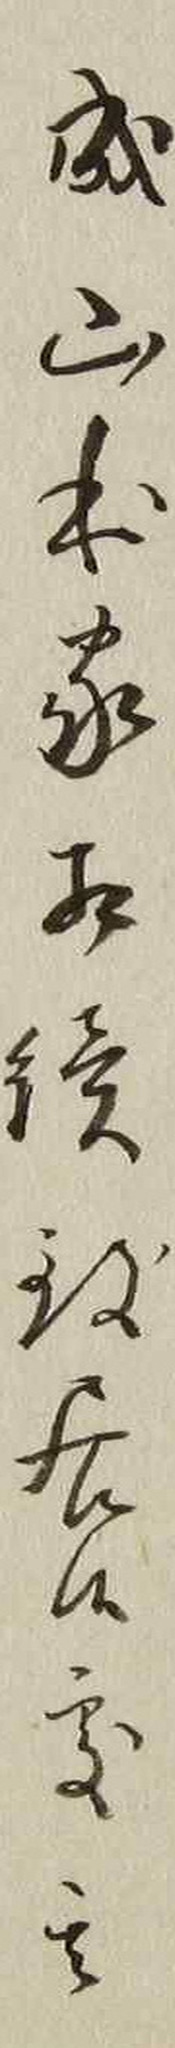成山本家相続致居候処其
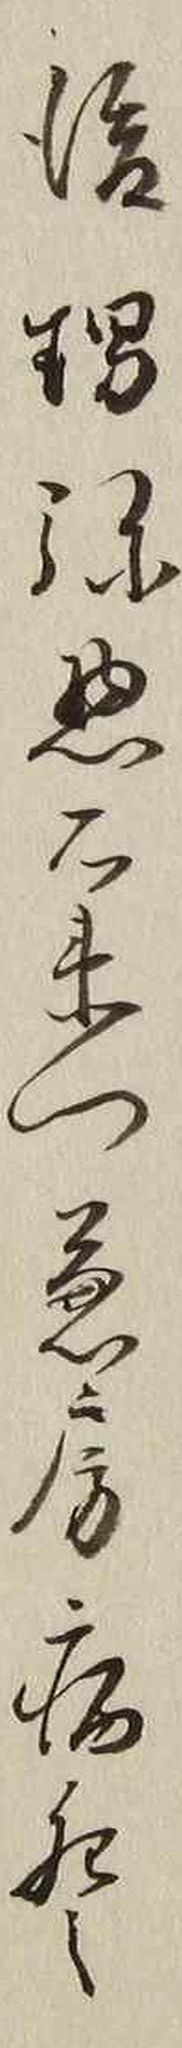後甥弥惣右衛門兼房病死之
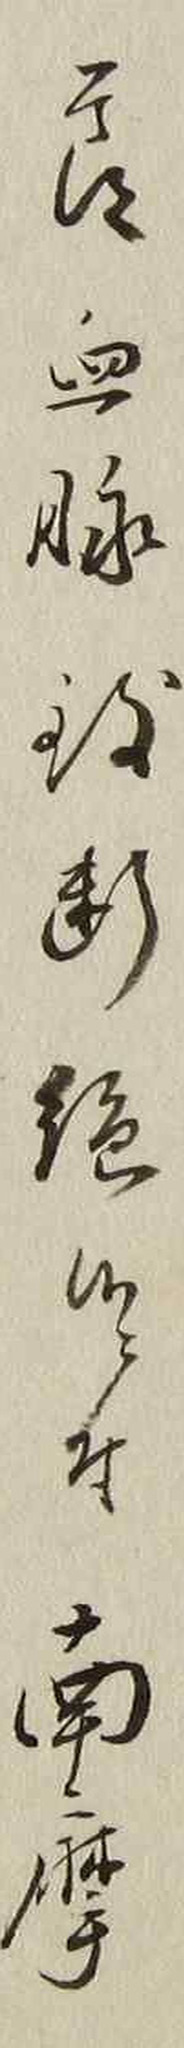節皿脈致断絶候に付南摩
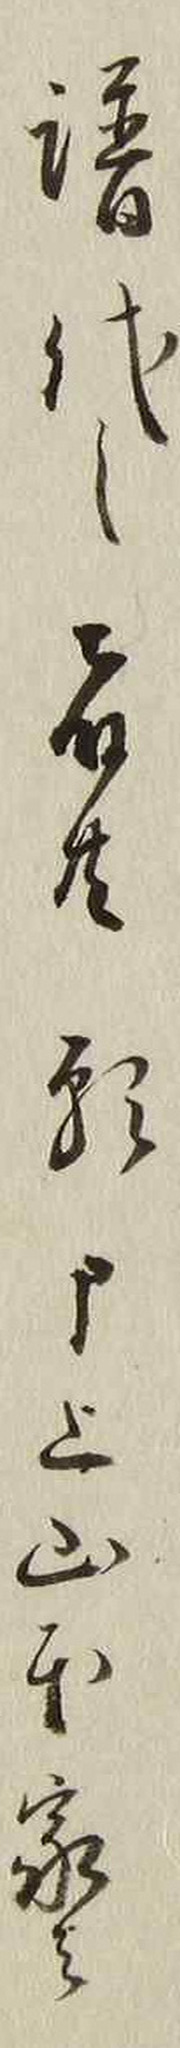譜代之者共願申上山本家之
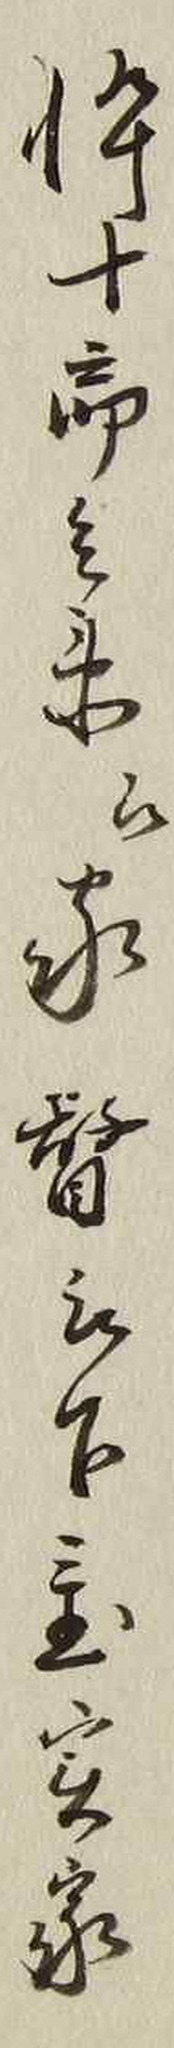忰十郎兵衛へ家督被下置実家
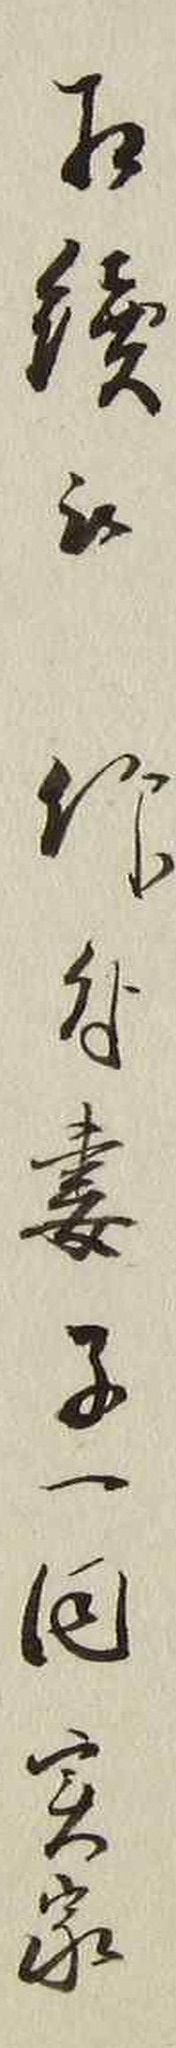相続被仰付妻子一同実家
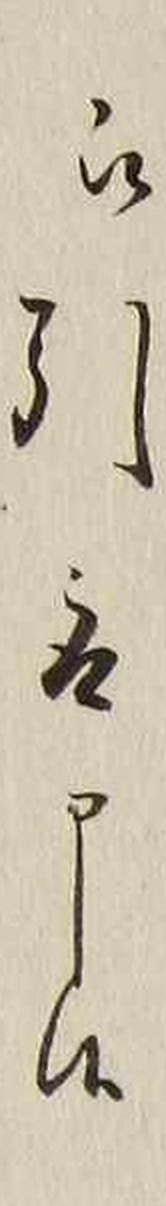江引取申候

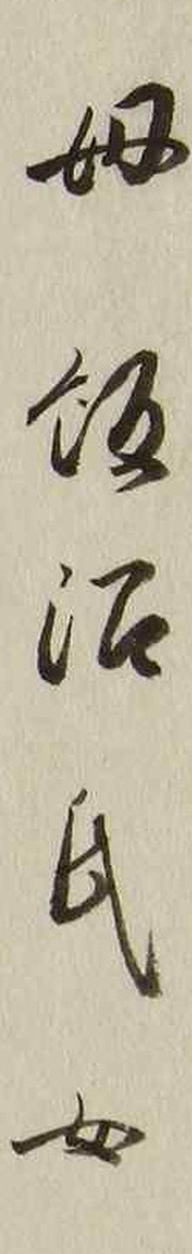母飯沼氏女
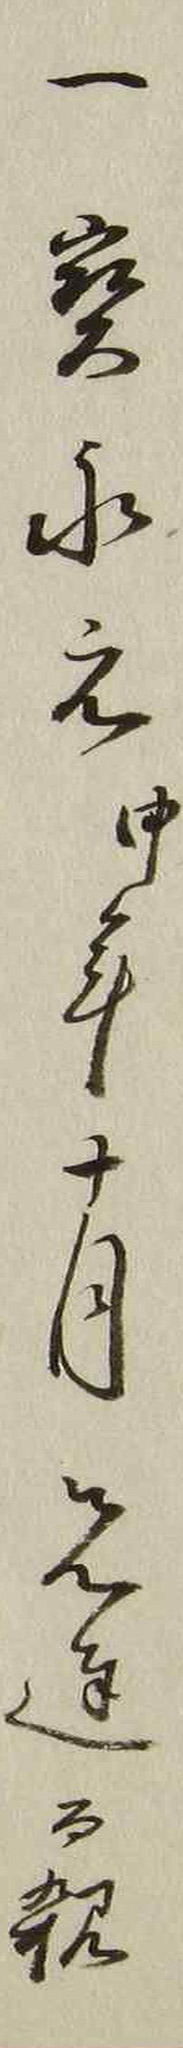一宝永元申年十月先達而親
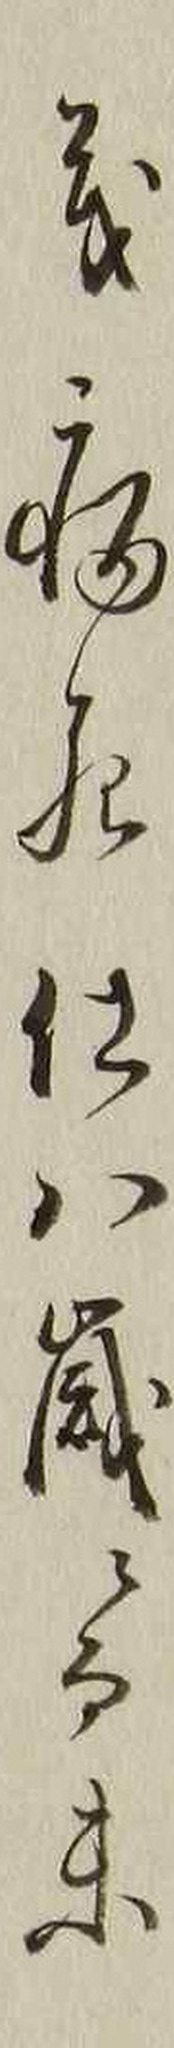義病死仕八歳に而未
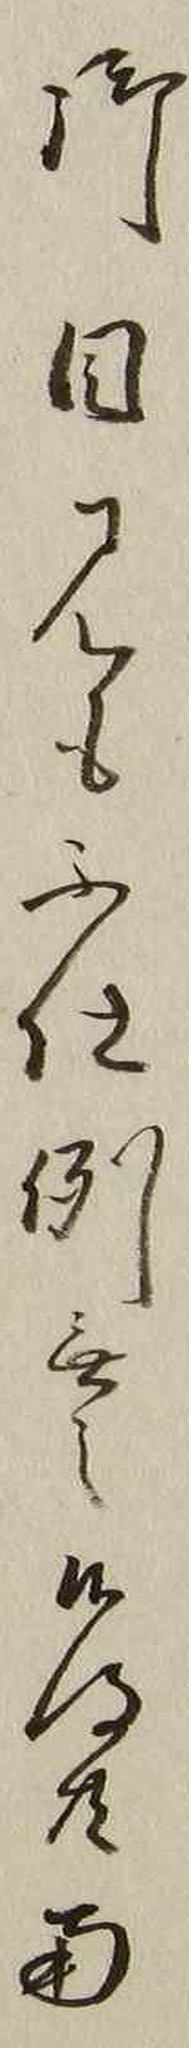御目見も不仕例無之候得共南
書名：諸士系譜　巻之159　な之部1
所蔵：会津若松市立会津図書館
